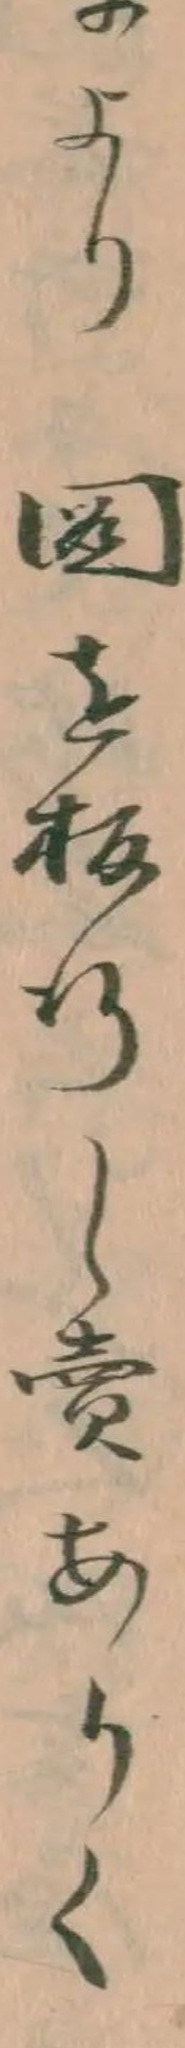により図を板行し売ありく
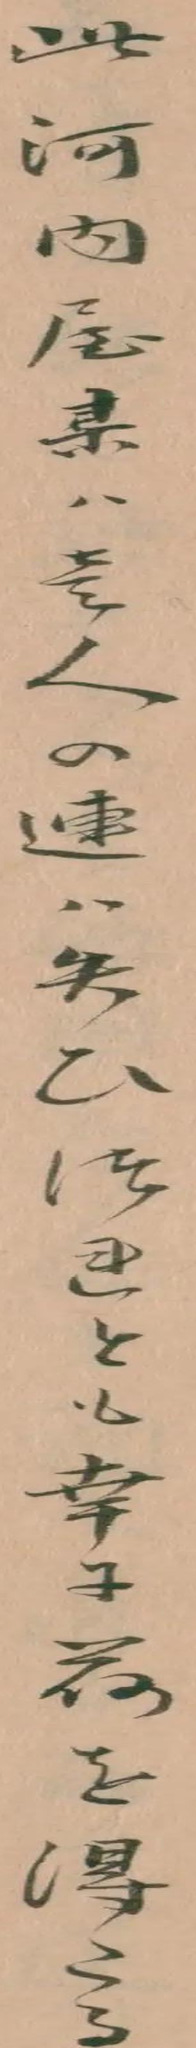此河内屋某ハ壱人の連ハ失ひすれとも幸に荷を得たる
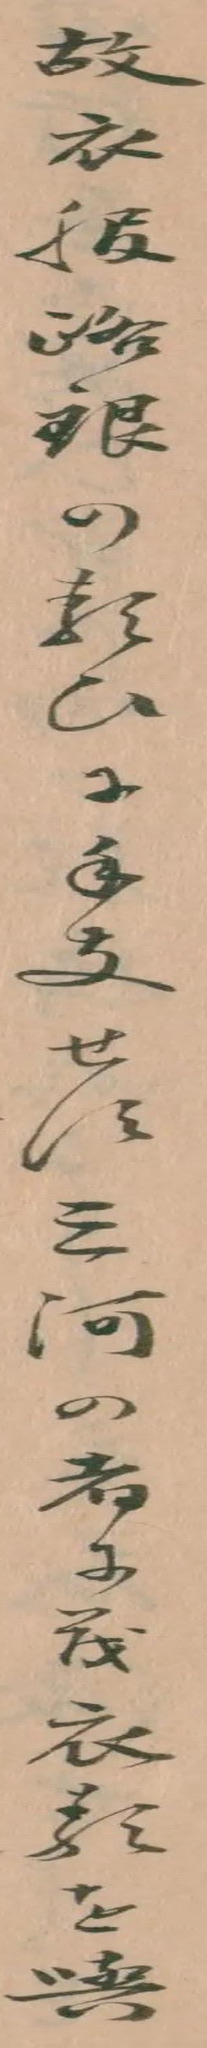故衣類路銀の類に手支せす三河の者にも衣類を与
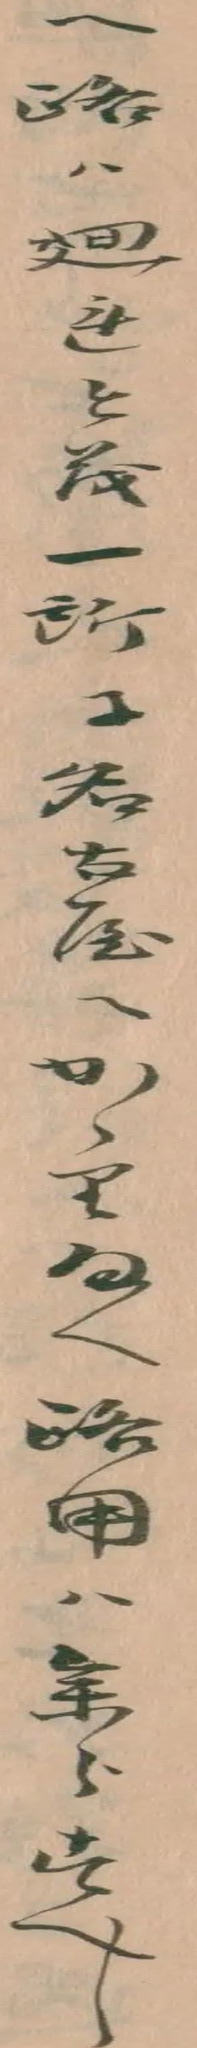へ路ハ廻れとも一所に名古屋へかゝりいく路用ハ参らへし
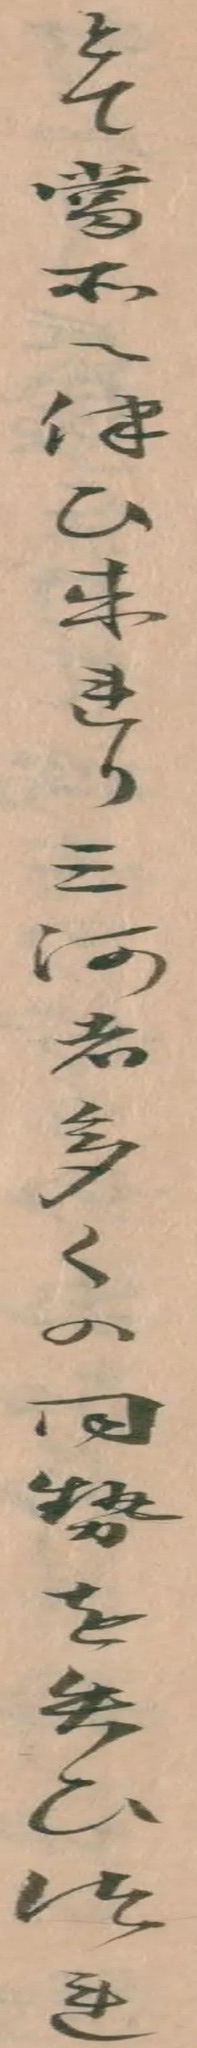とて当所へ伝ひ来れり三河者多くの同勢を失ひつれ
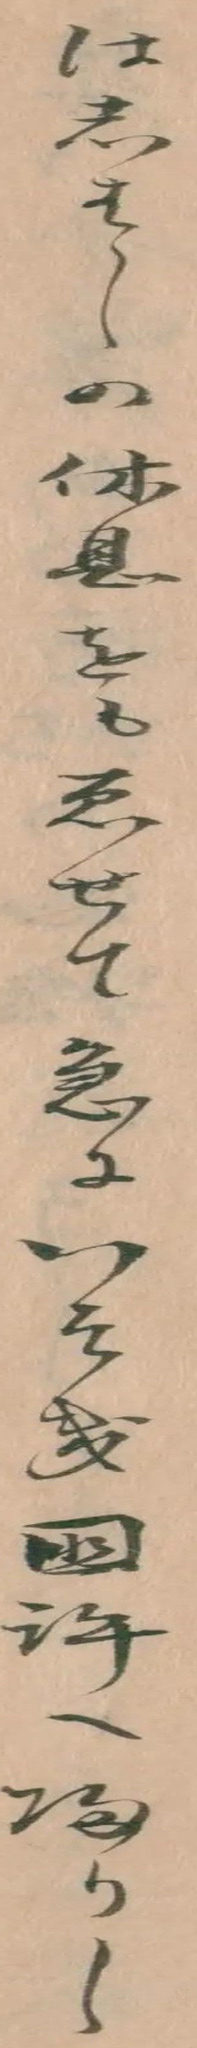はしはしの休息をも急せて急きにいそき国許へ帰りし
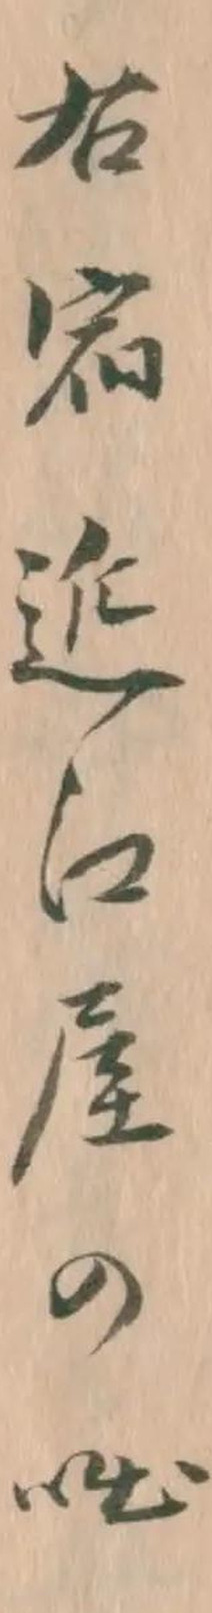右宿近江屋の咄
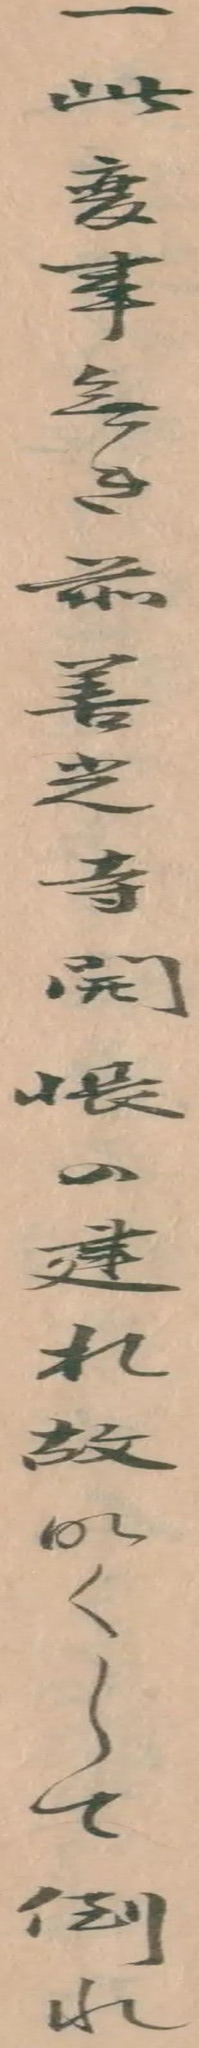一此変事無キ前善光寺開帳の建札故なくして倒れ

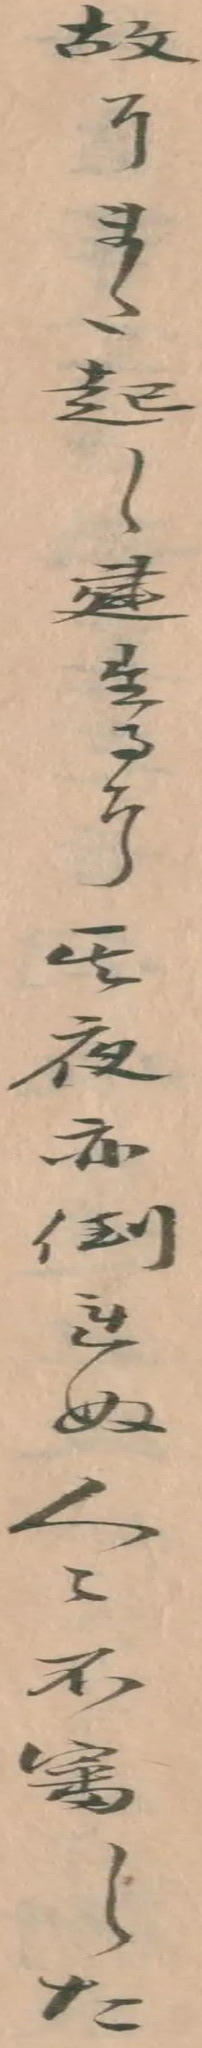故にまた起し建たるに其夜亦倒れぬ人々不審した
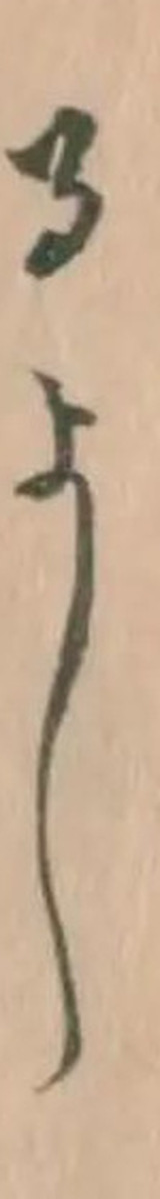るよし
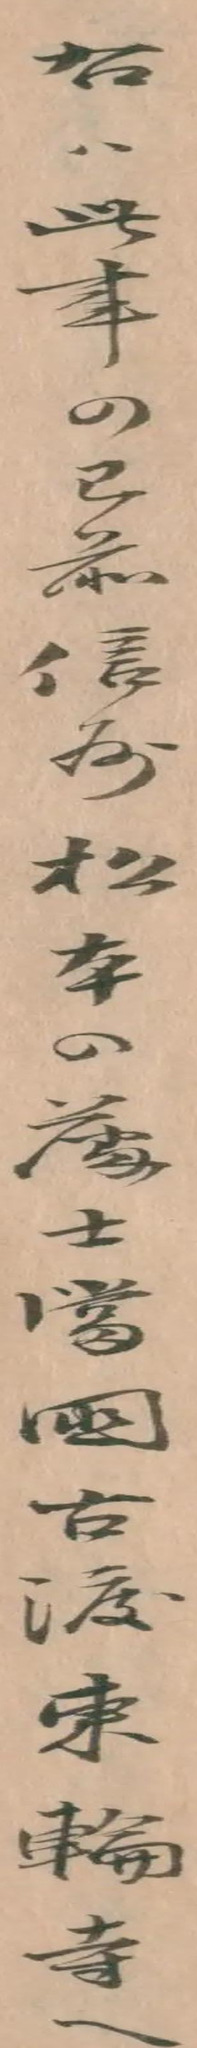右ハ此事の已前信州松本の藩士当国古渡東輪寺へ
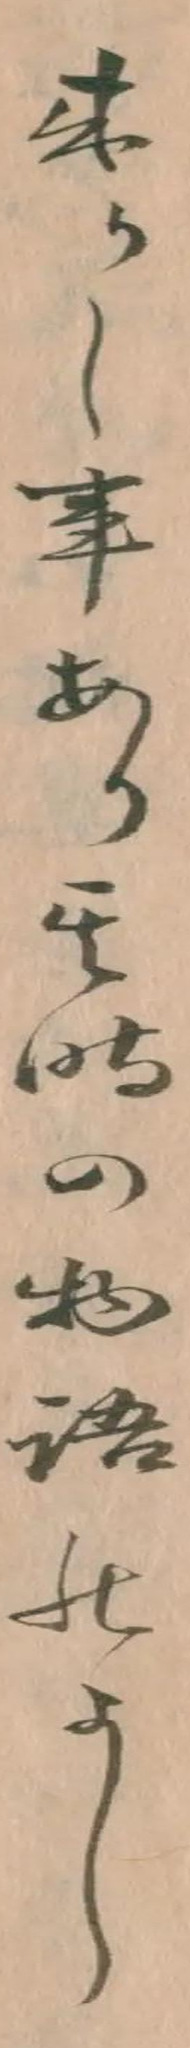来りし事あり其時の物語のよし
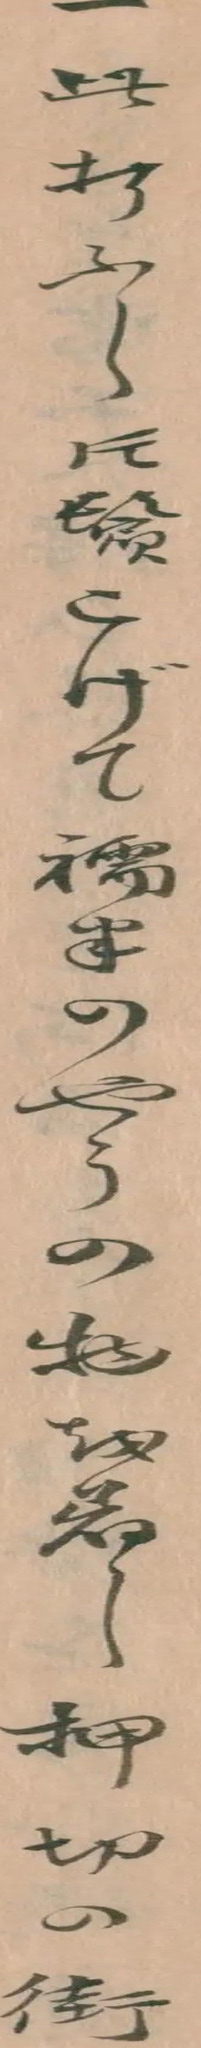一この折ふし片髪こげて襦袢のやらの物を着し押切の街
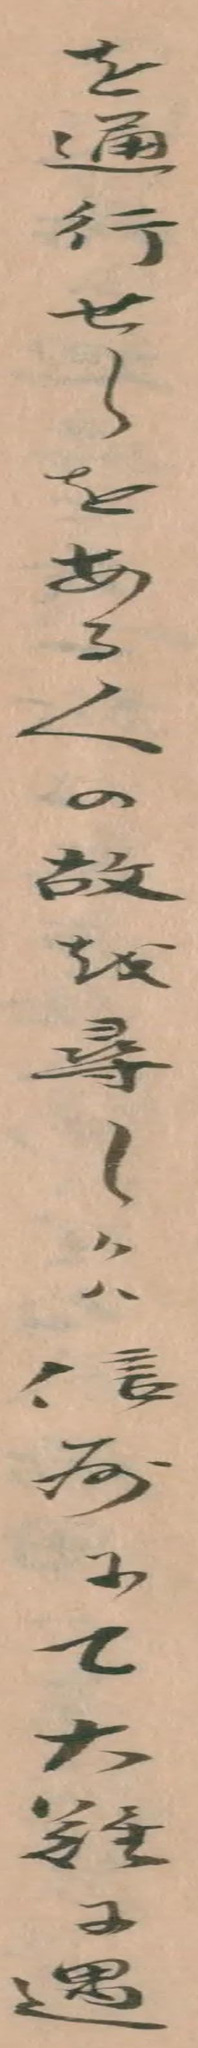を通行せしをある人の故を尋しかハ信州にて大難に遭
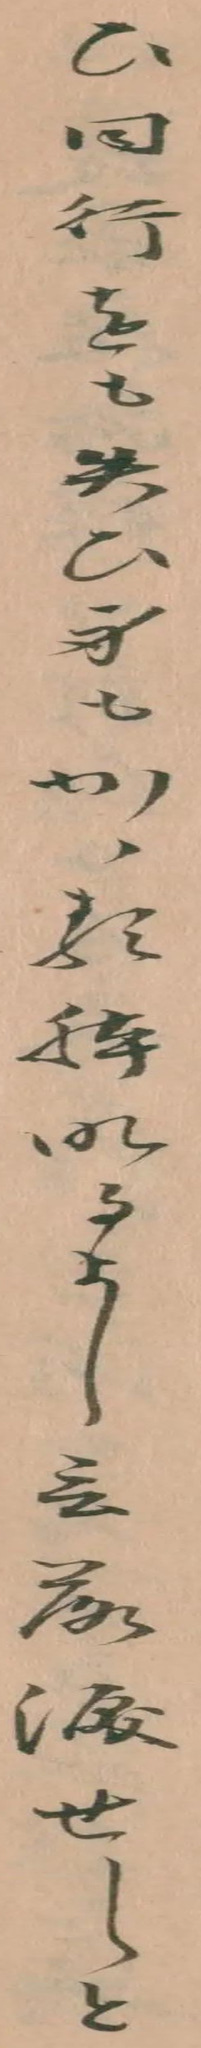ひ同行をも失ひ身もかゝる体なるよし云落涙せしと
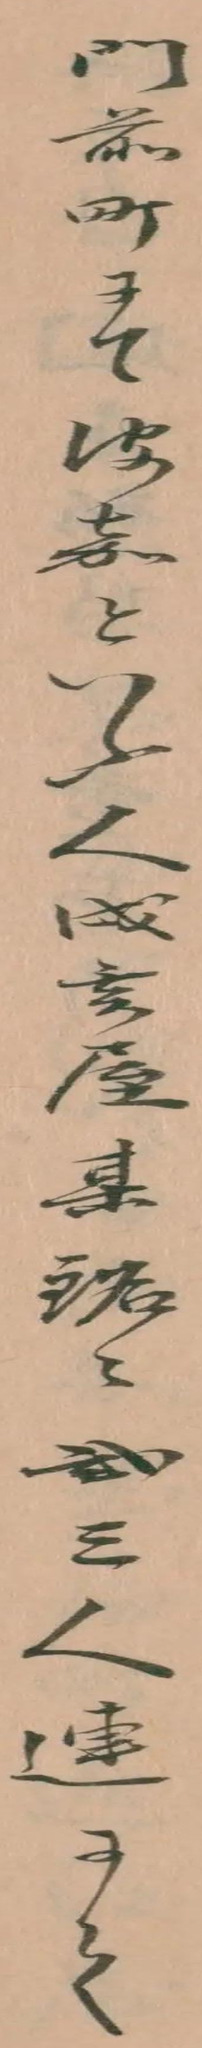一門前町にて波嘉といふ人戌亥屋某銘々弐三人連にて
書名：地災撮要. 巻3(地震之部)-巻4(噴火之部)
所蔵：国立国会図書館 National Diet Library, JAPAN
